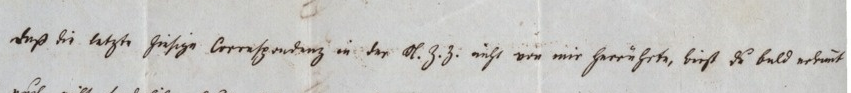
Daß die letzte hiesige Correspondenz in der N.Z.Z. nicht von mir herrührte, wirst du bald erkannt
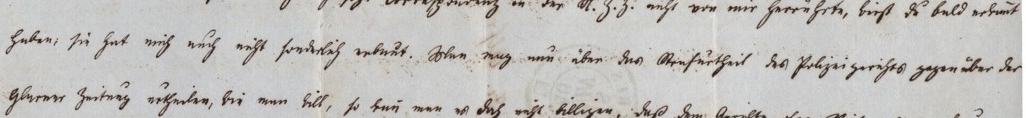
haben; sie hat mich auch nicht sonderlich erbaut. Man mag nun über das Strafurtheil des Polizeigerichts gegenüber der
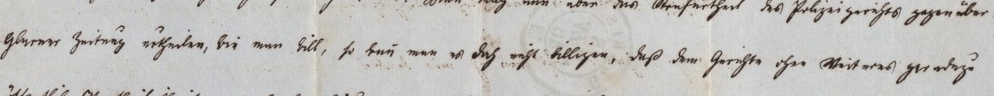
Glarner Zeitung urtheilen, wie man will, so kann man es doch nicht billigen, daß dem Gerichte ohne Weiteres geradezu
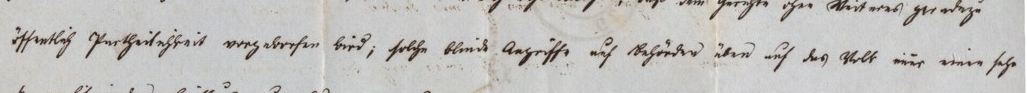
öffentlich Partheilichkeit vorgeworfen wird; solche blinde Angriffe auf Behörden üben auf das Volk immer einen sehr
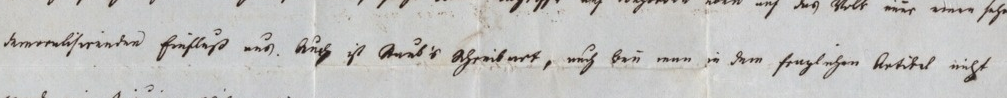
demoralisirenden Einfluß aus. Auch ist Staub's Schreibart, auch wenn man in dem fraglichen Artikel nicht
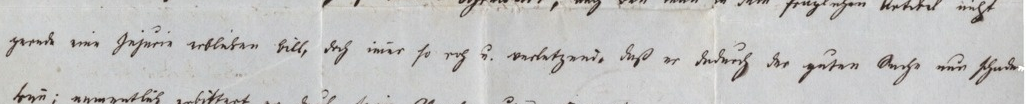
gerade eine Injurie erblicken will, doch immer so roh u. verletzend, daß er dadurch der guten Sache nur schaden
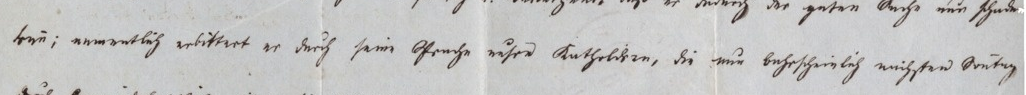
kann; namentlich erbittert er durch seine Sprache unsre Katholiken, die nun wahrscheinlich nächsten Sonntag
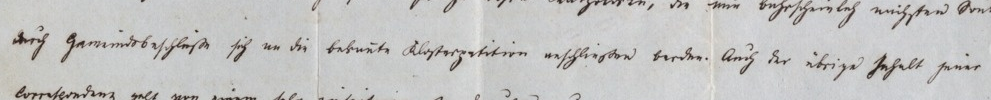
durch Gemeindsbeschlüsse sich an die bekannte Klosterpetition anschließen werden. Auch der übrige Inhalt jener
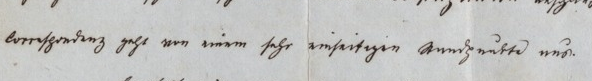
Correspondenz geht von einem sehr einseitigen Standpunkte aus.
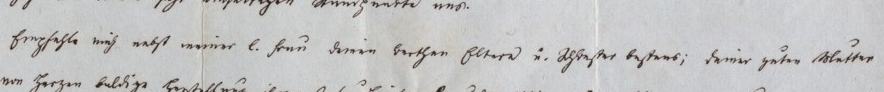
Empfehle mich nebst meiner l. Frau, deinen werthen Eltern u. Schwester bestens; deiner guten Mutter
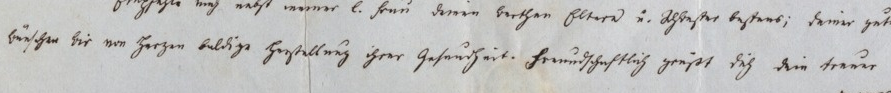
wünschen wir von Herzen baldige Herstellung ihrer Gesundheit. Freundschaftlich grüßt dich dein treuer
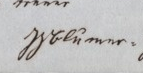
J J Blumer-Heer.
